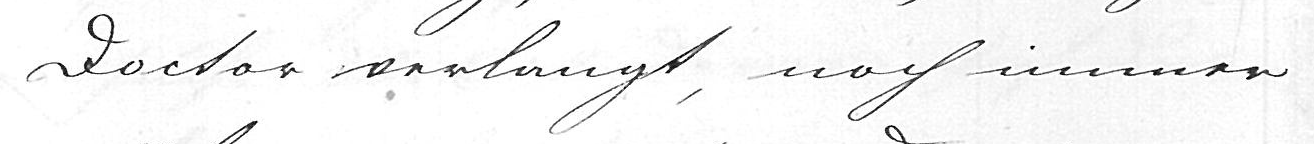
Doctor verlangt, noch immer
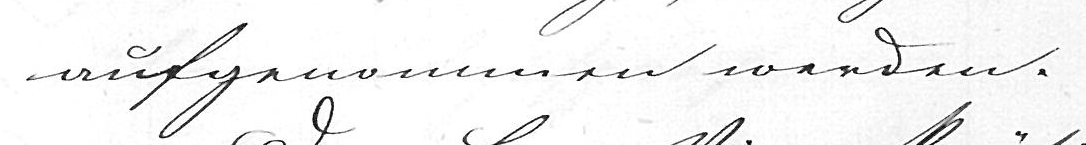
aufgenommen werden.
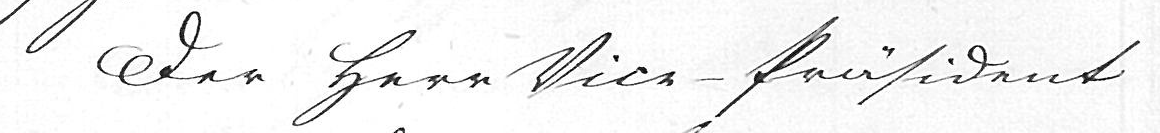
Der Herr Vice-Präsident
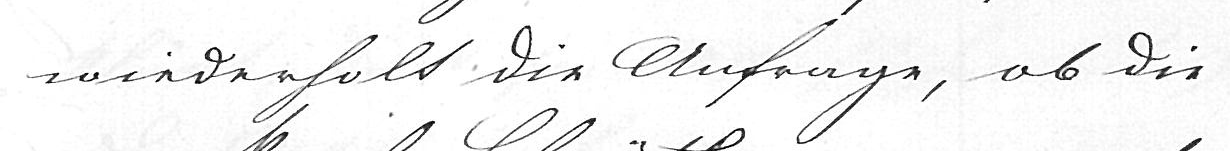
wiederholt die Anfrage, ob die
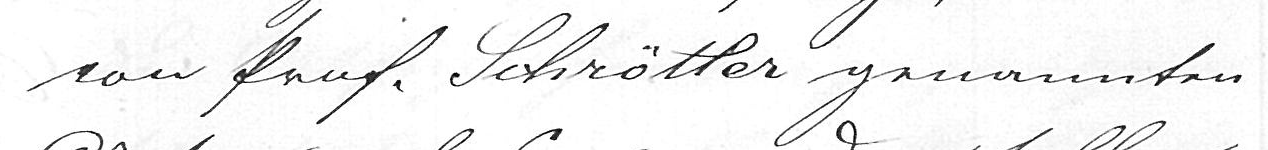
von Prof. Schrötter genannten
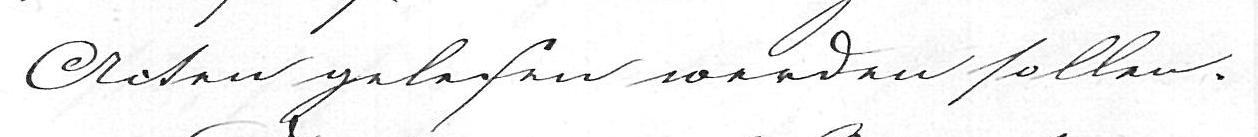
Acten gelesen werden sollen.
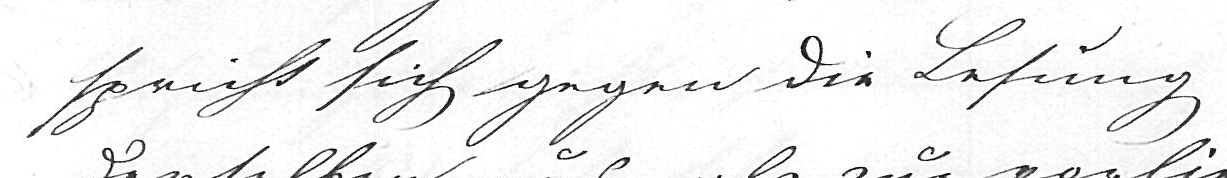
spricht sich gegen die Lesung
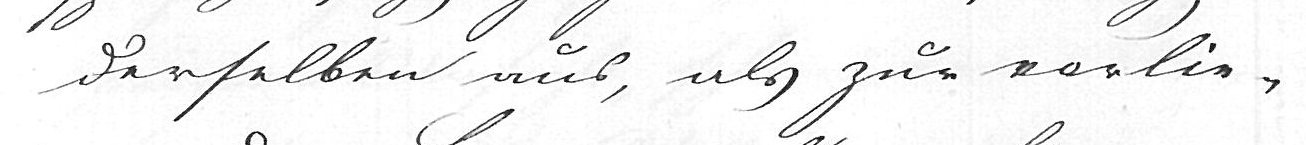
derselben aus, als zur vorlie-
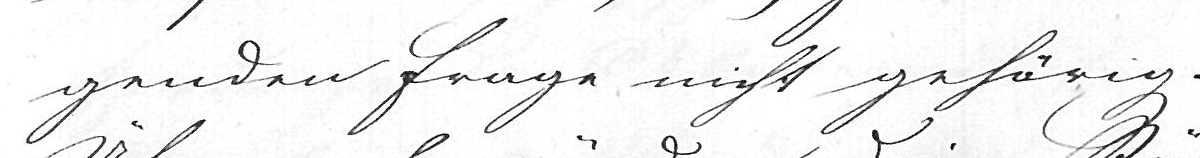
genden Frage nicht gehörig.
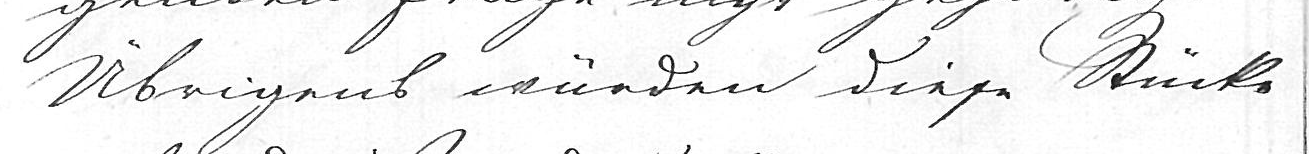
Übrigens würden diese Stücke
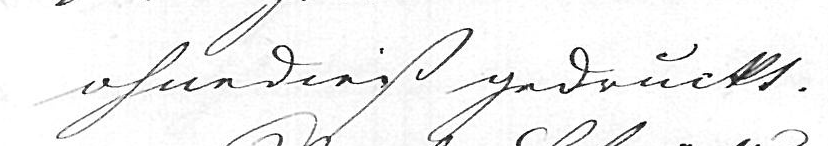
ohnedieß gedruckt.
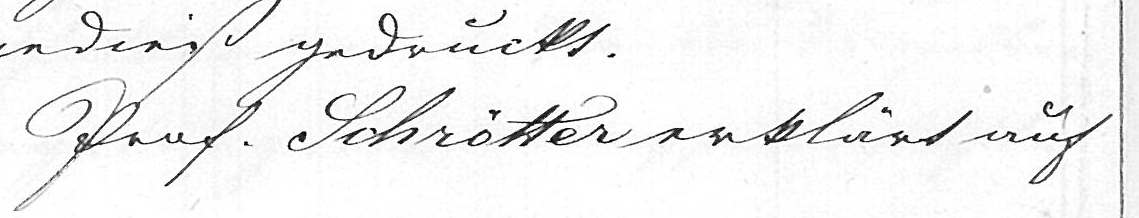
Prof. Schrötter erklärt auf
